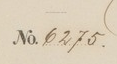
No 6275.
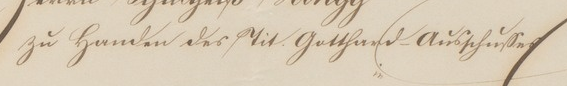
zu Handen des Tit. Gotthard-Ausschusses
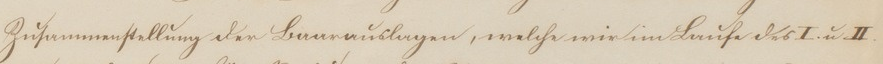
Zusammenstellung der Baarauslagen, welche wir im Laufe des I. u II.
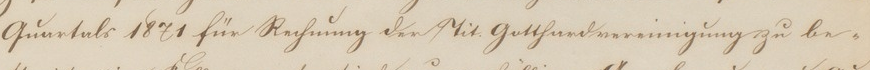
Quartals 1871 für Rechnung der Tit. Gotthardvereinigung zu be-
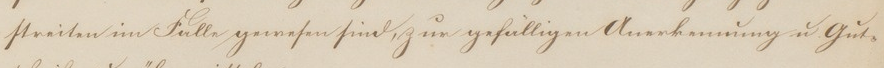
streiten im Falle gewesen sind, zur gefälligen Anerkennung u. Gut-
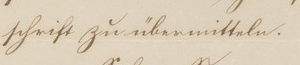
schrift zu übermitteln.
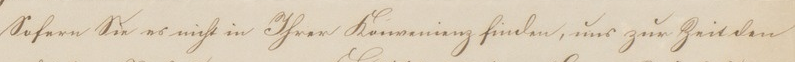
Sofern Sie es nicht in Ihrer Konvenienz finden, uns zur Zeit den
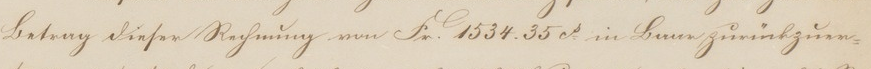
Betrag dieser Rechnung von Fr. 1534.35 cs in Baar zurückzuer-
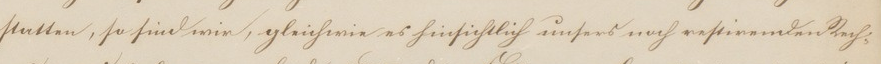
statten, so sind wir, gleichwie es hinsichtlich noch restirenden Rech-
